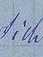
sich
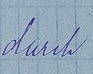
masslose
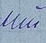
Arbeit
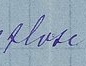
für andere
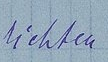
richten.
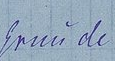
Sehr leid
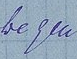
Sie wegen
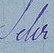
mühen
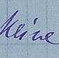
sollen.
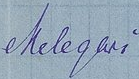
Melegari
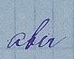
aber
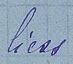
keine
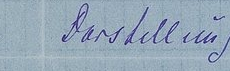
Darstellung
